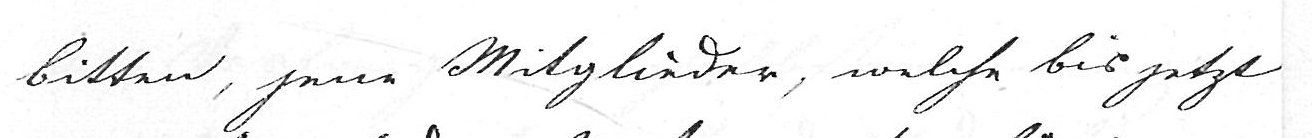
bitten, jene Mitglieder, welche bis jetzt
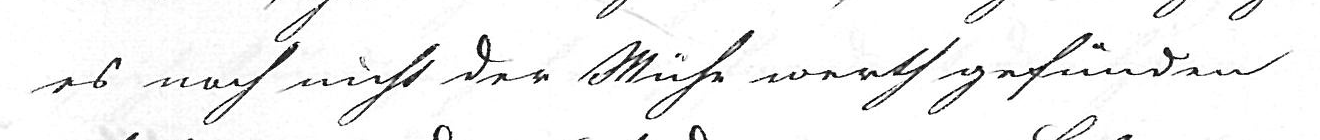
es noch nicht der Mühe werth gefünden
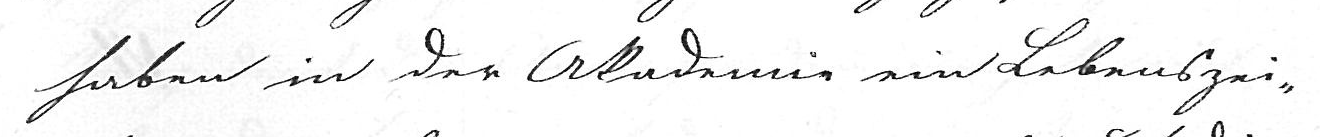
haben in der Akademie ein Lebenszei-
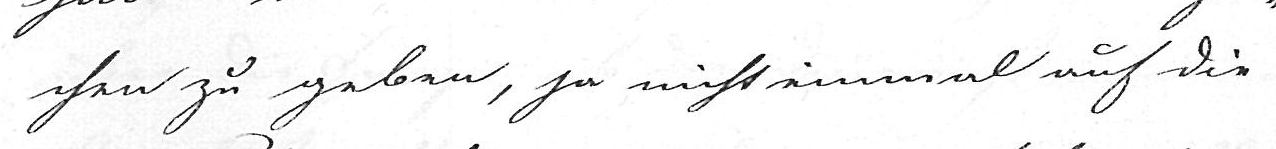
chen zu geben, ja nicht einmal auf die
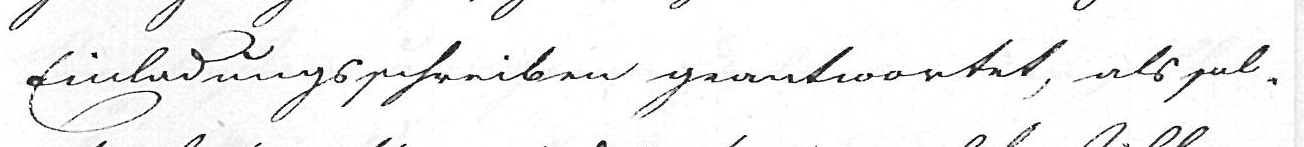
Einladungsschreiben geantwortet, als sol-
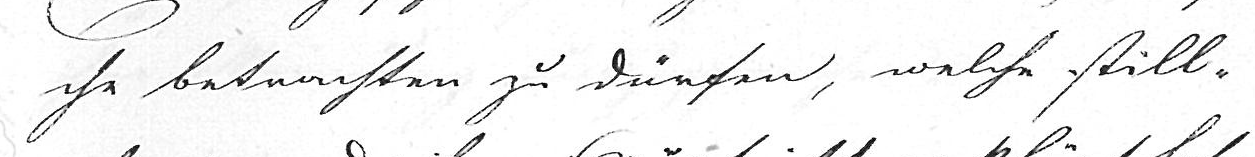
che betrachten zu dürfen, welche still-
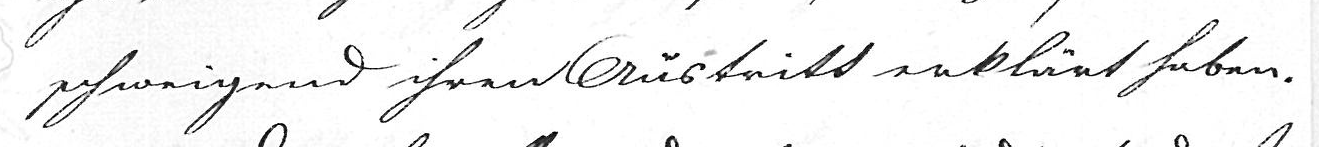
schweigend ihren Austritt erklärt haben.
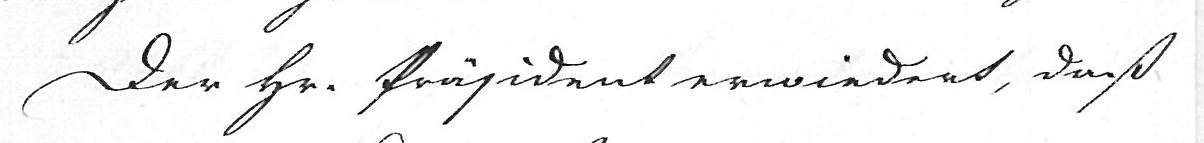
Der Hr. Präsident erwiedert, daß
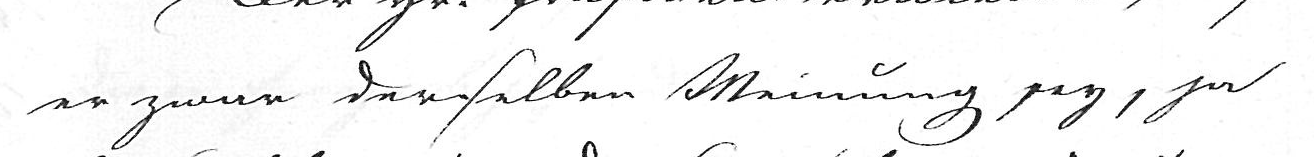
er zwar derselben Meinung sey, ja
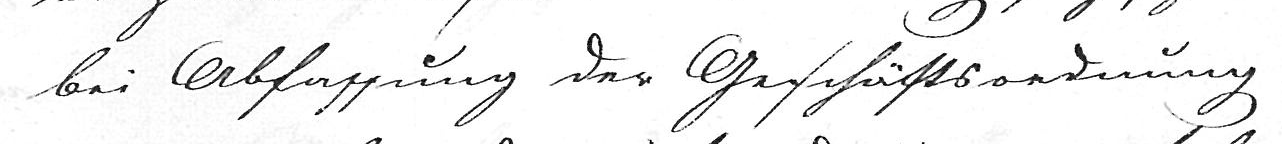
bei Abfassung der Geschäftsordnung
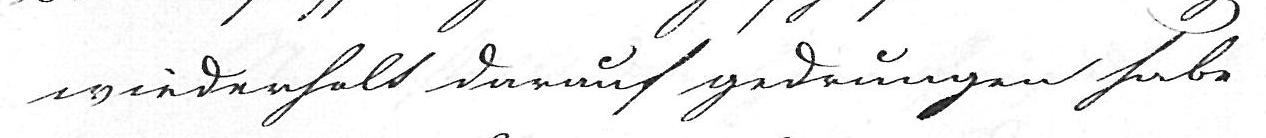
wiederholt darauf gedrungen habe
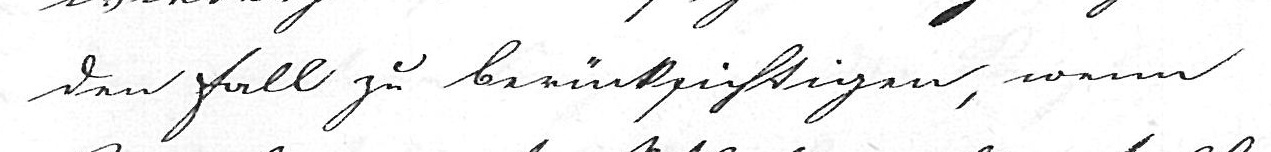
den Fall zu berücksichtigen, wenn
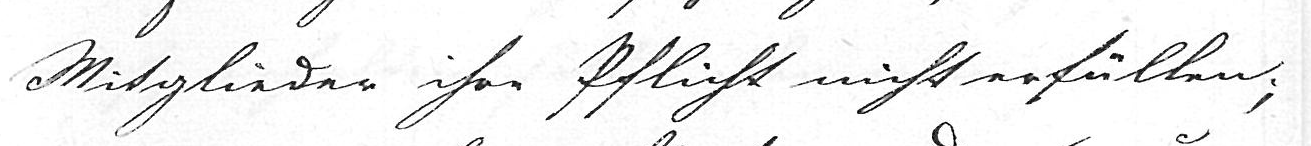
Mitglieder ihre Pflicht nicht erfüllen:
